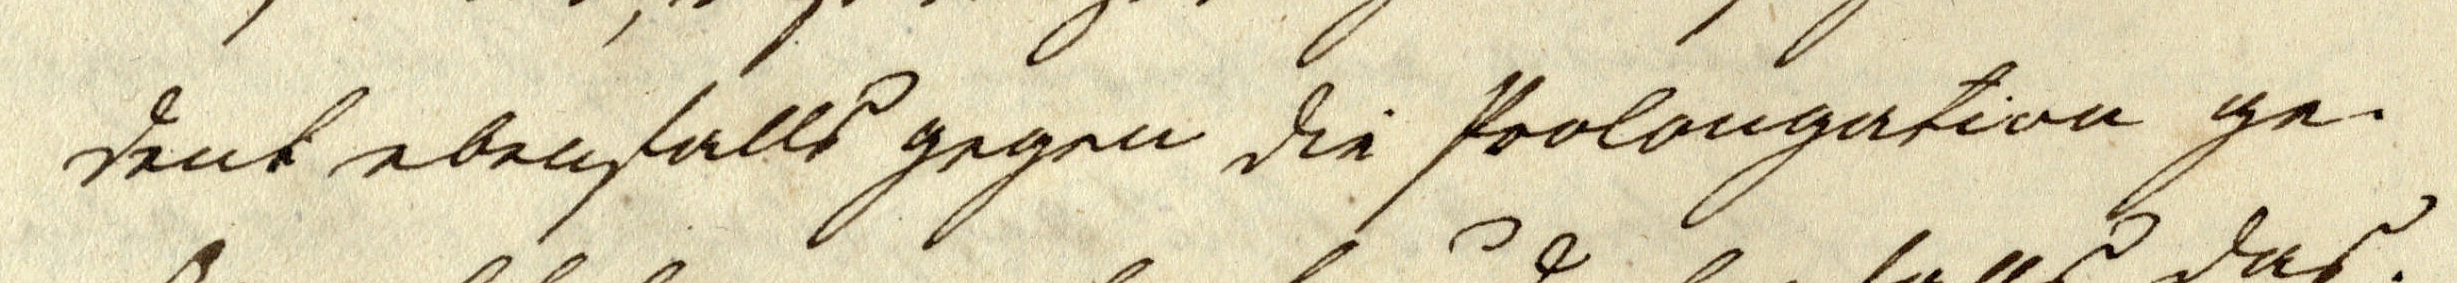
dent ebenfalls gegen die Prolongation ge¬
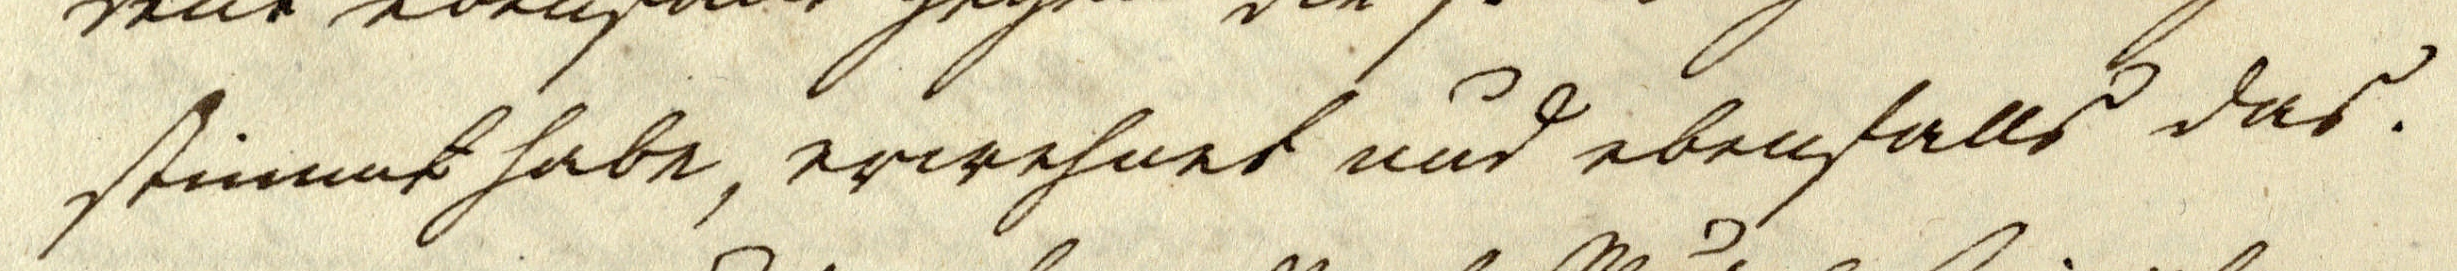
stimmt habe, erwehnet und ebenfalls das¬
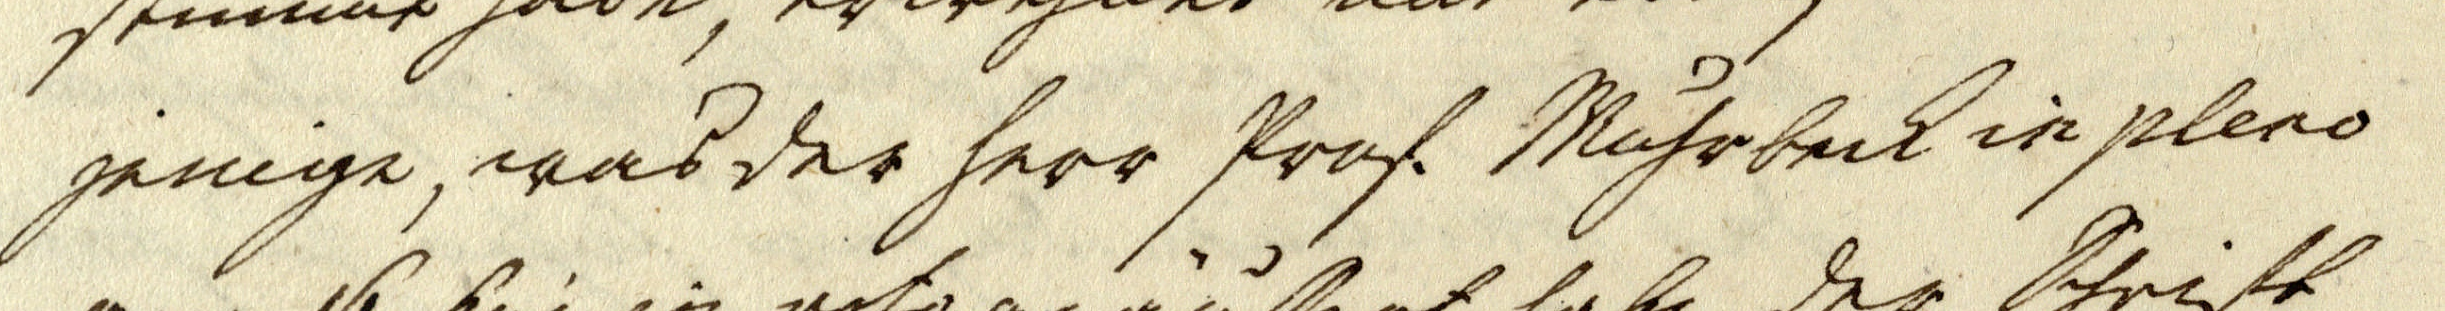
jenige, was der Herr Prof. Muhrbeck in pleno
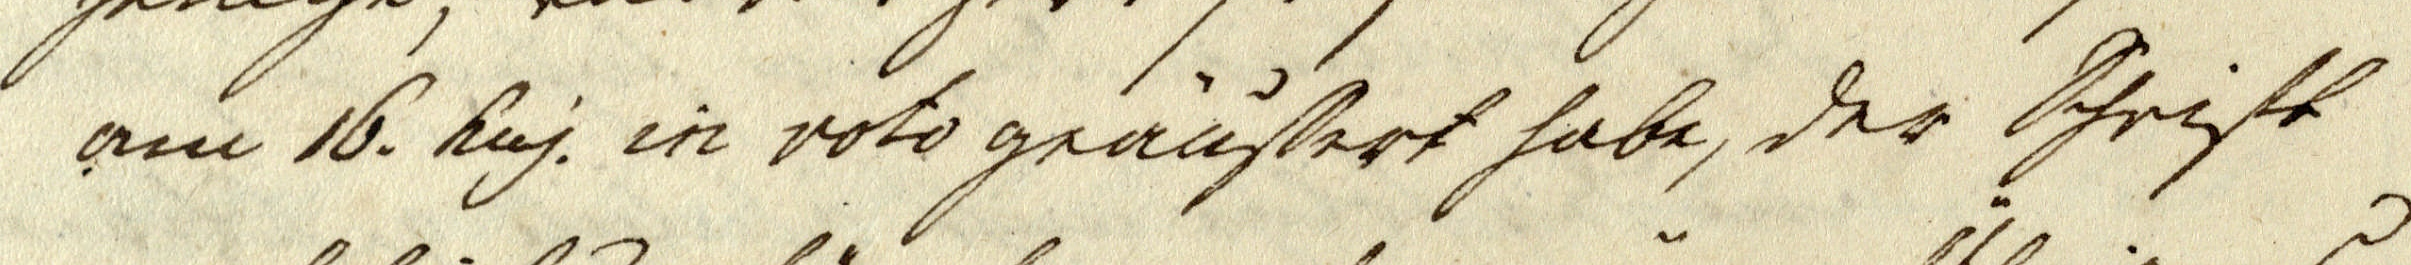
am 16. huj. in voto geäussert habe, der Schrift
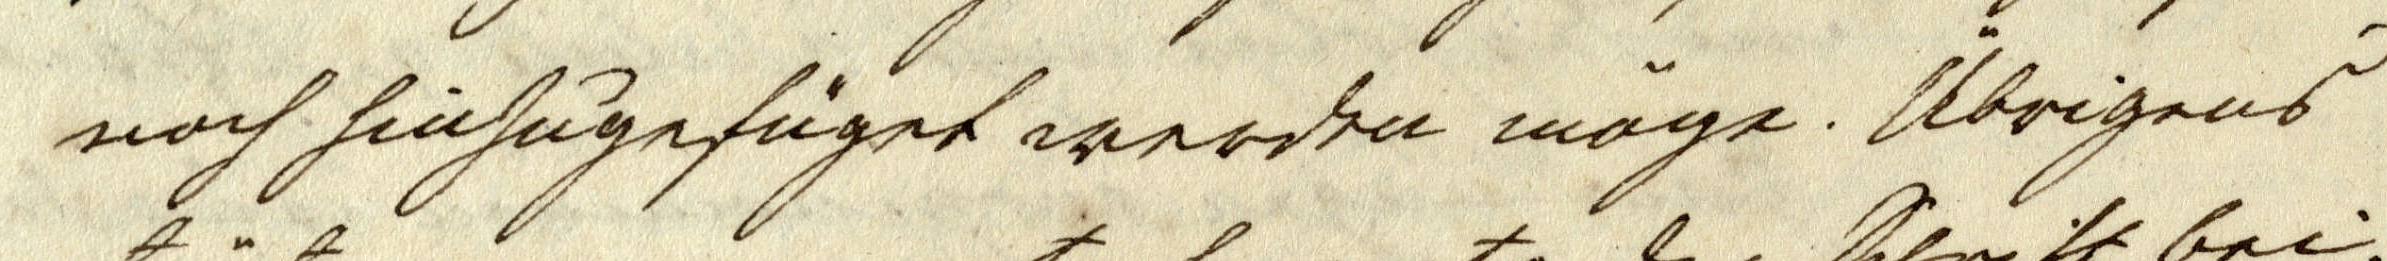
noch hinzugefüget werden möge. Übrigens
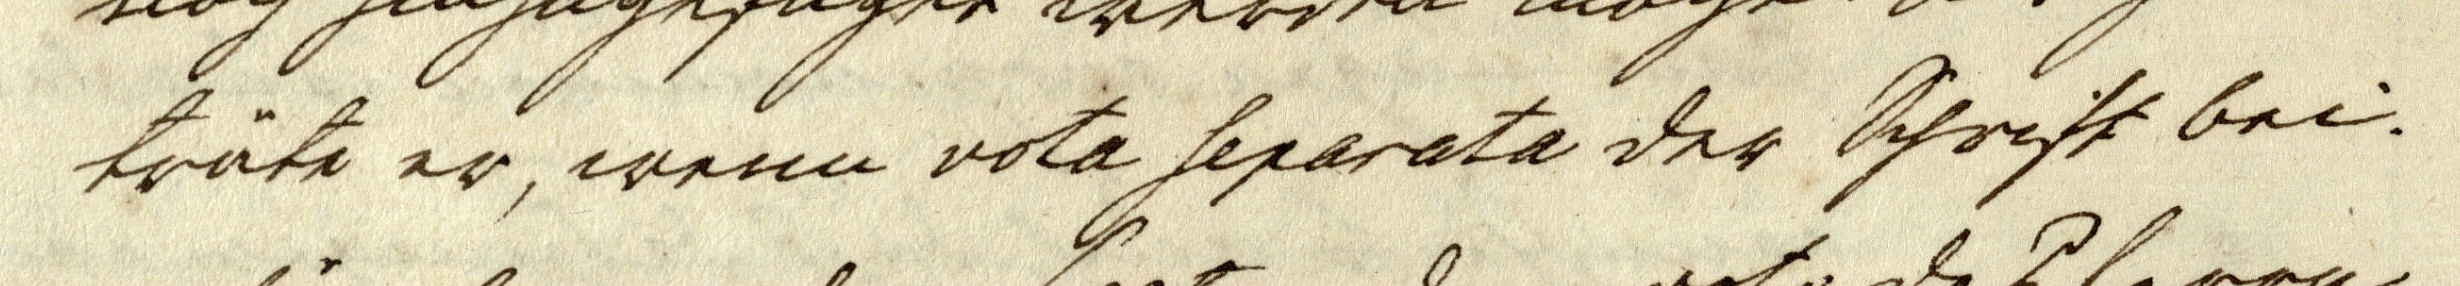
träte er, wenn vota separata der Schrift bei¬
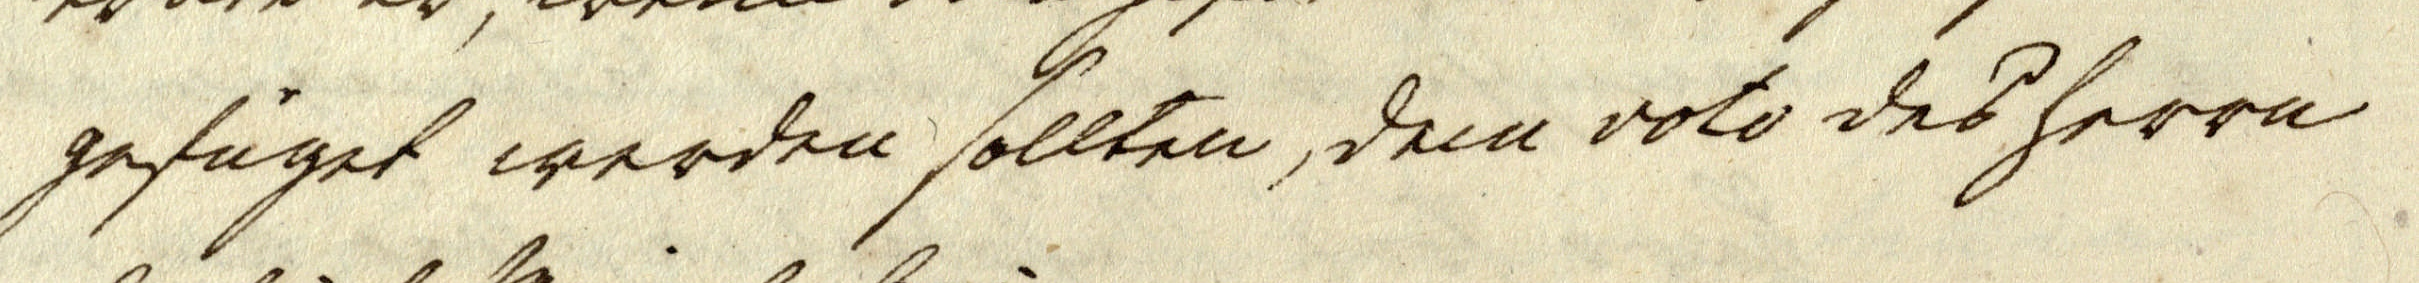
gefüget werden sollten, dem voto des Herrn
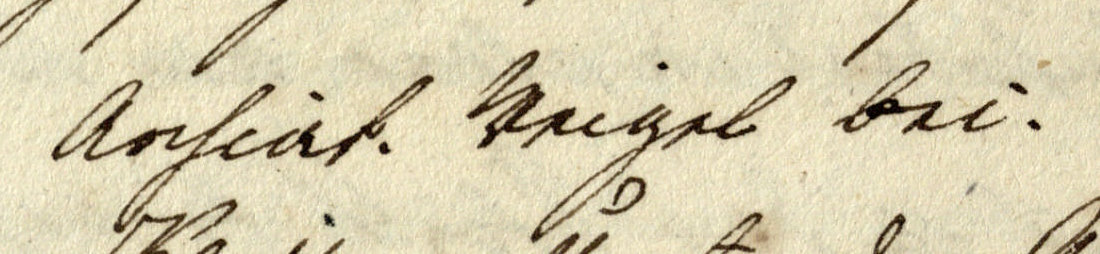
Archiat. Weigel bei.
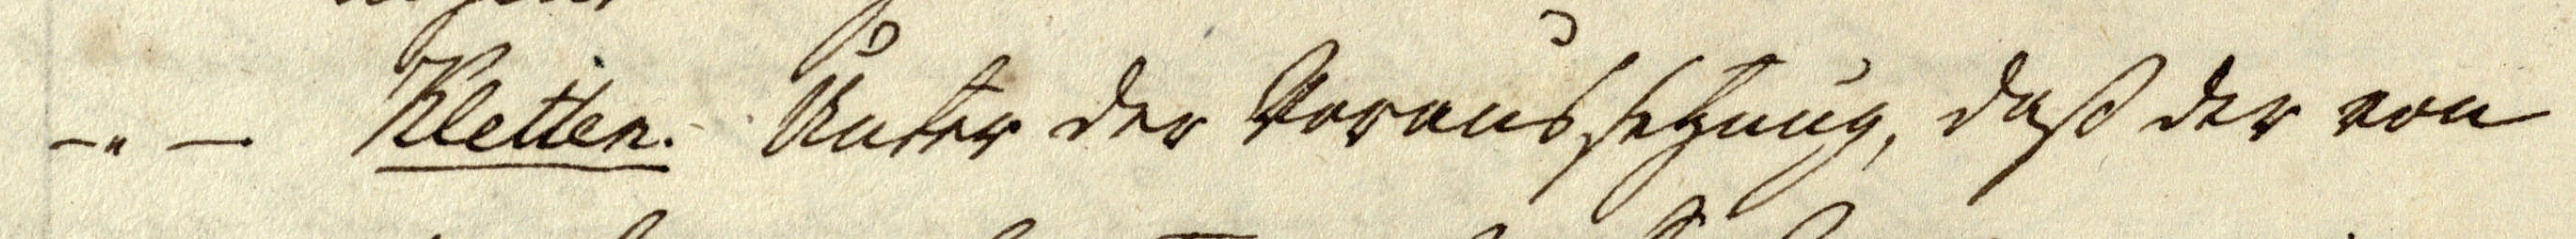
Kletten. Unter der Voraussetzung, daß der von
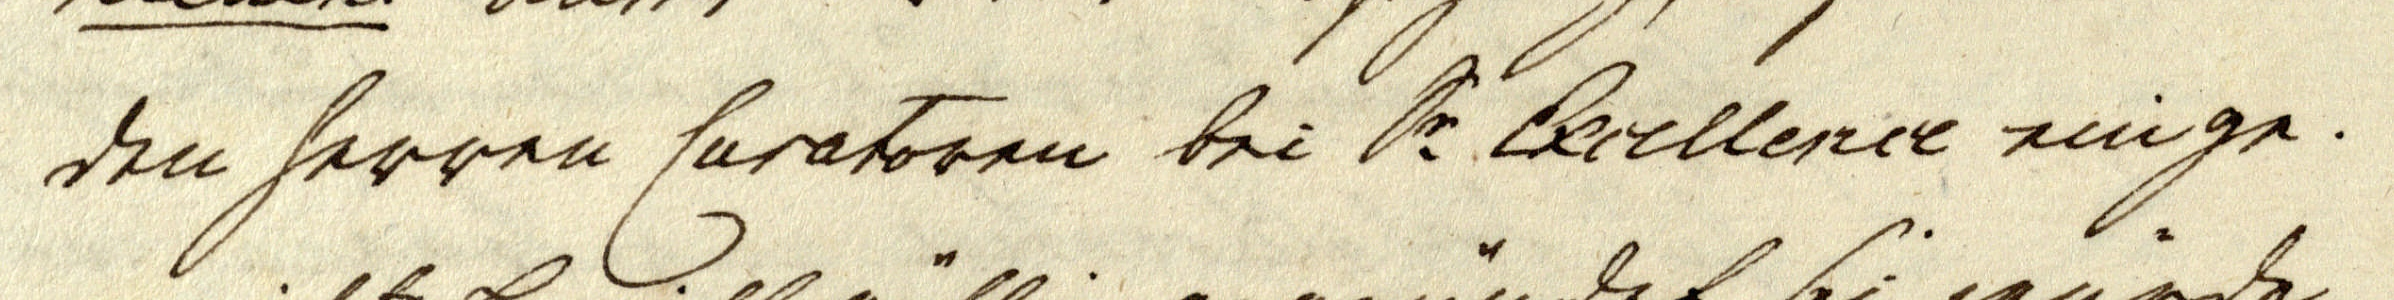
den Herren Curatoren bei Sr Excellence einge¬
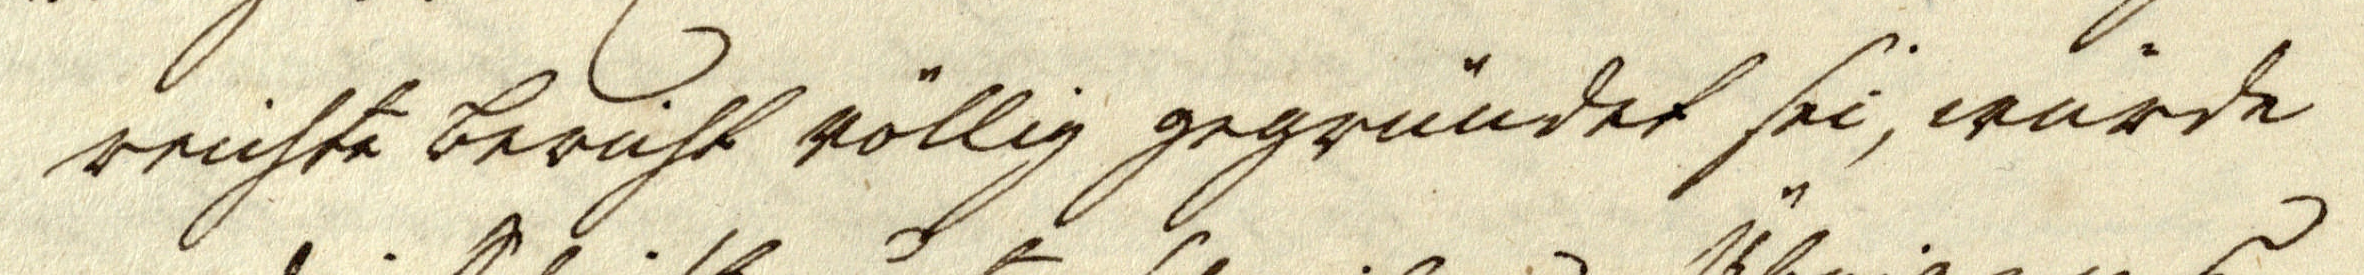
reichte Bericht völlig gegründet sei, würde
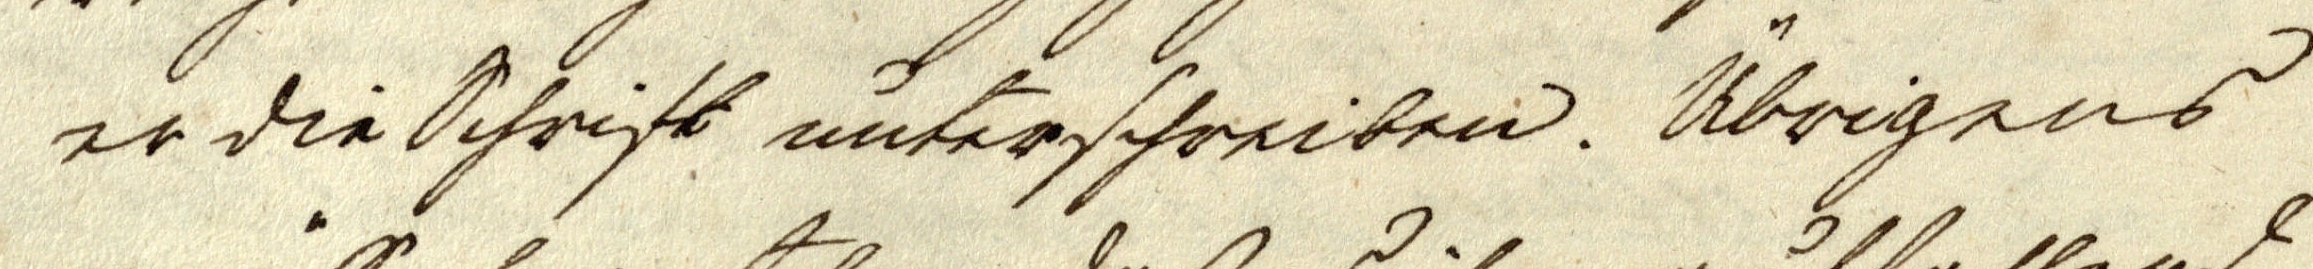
er die Schrift unterschreiben. Übrigens
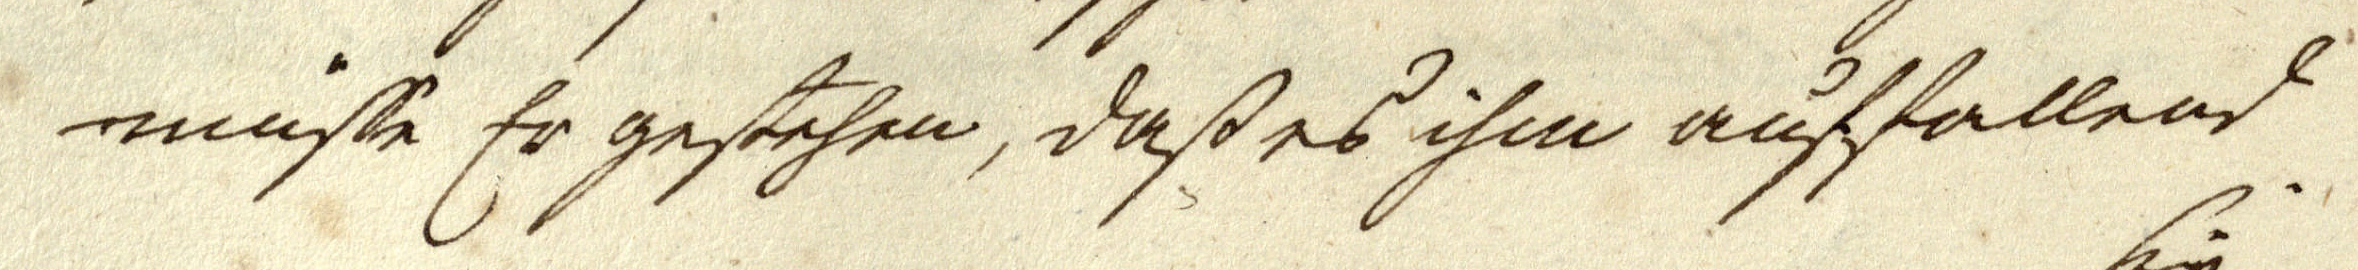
müsse Er gestehen, daß es ihm auffallend
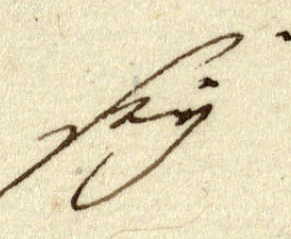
seÿ
